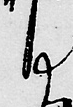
d.)
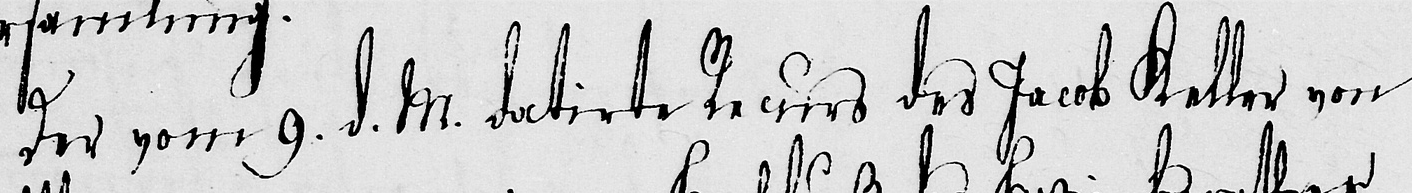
Der vom 9. d. M. datirte Recurs des Jacob Keller von
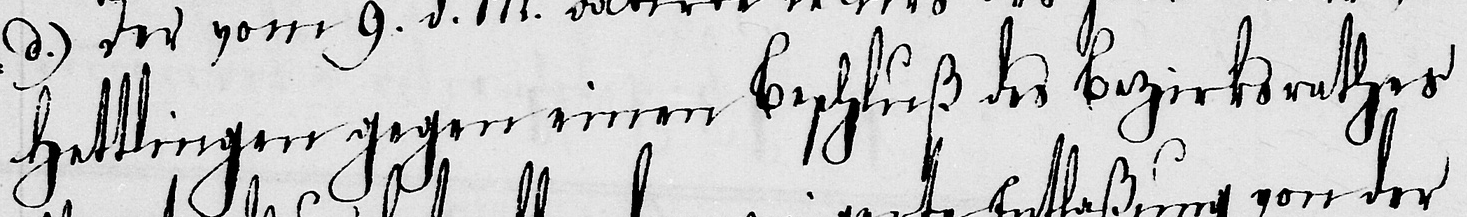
Hettlingen gegen einen Beschluß des Bezirksrathes
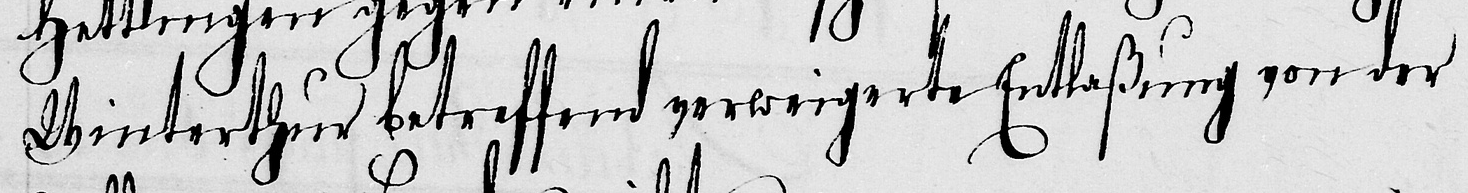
Winterthur betreffend verweigerte Entlaßung von der
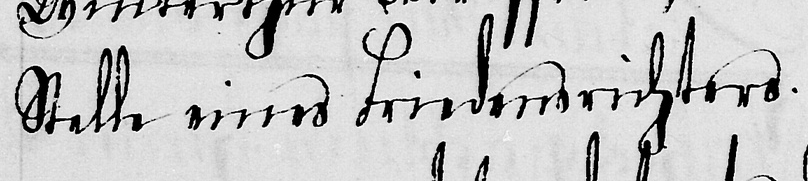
Stelle eines Friedensrichters.
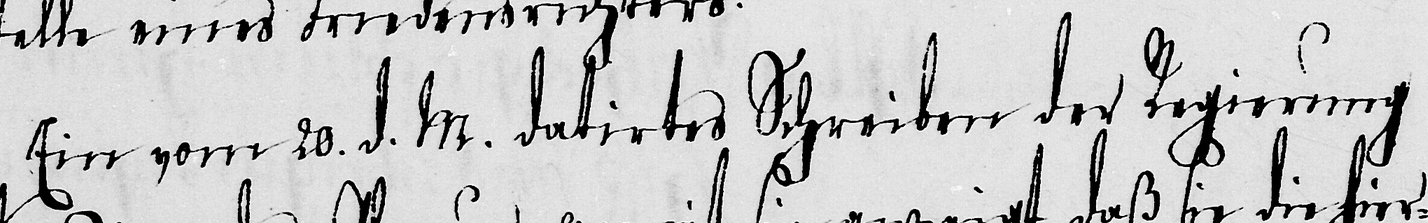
Ein vom 20. d. M. datirtes Schreiben der Regierung
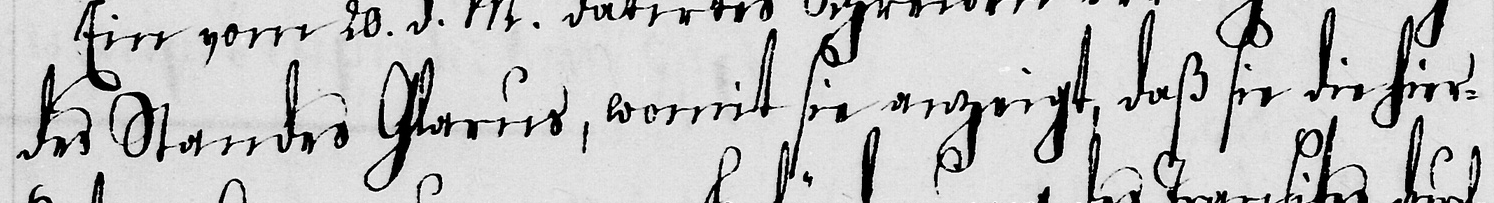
des Standes Glarus, womit sie anzeigt, daß sie die hier¬
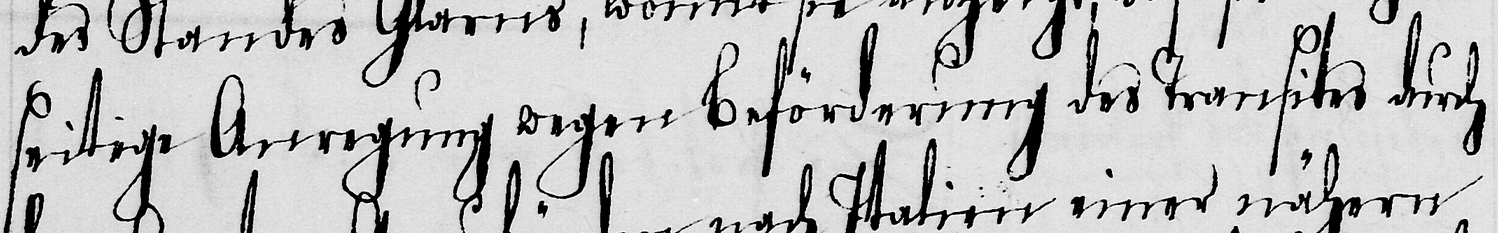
seitige Anregung wegen Beförderung des Transites durch
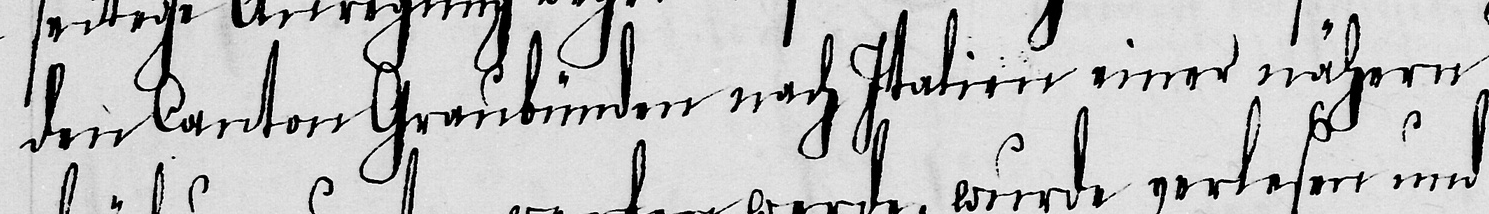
den Canton Graubünden nach Italien einer nähern
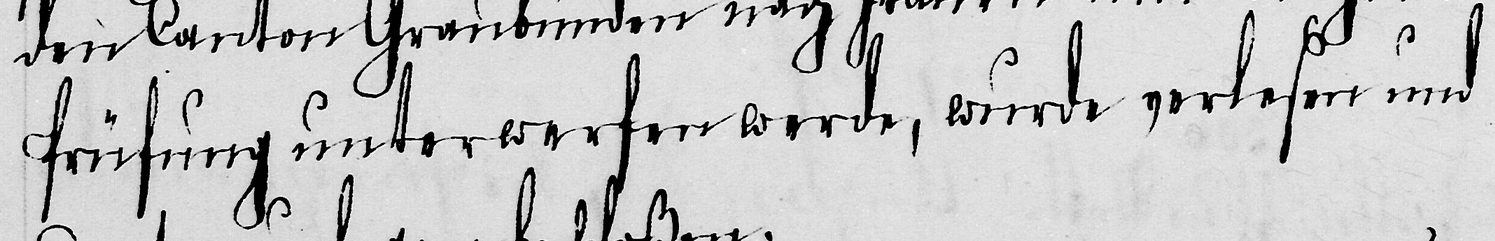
Prüfung unterwerfen werde, wurde verlesen und
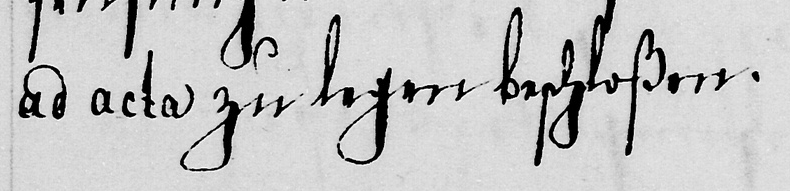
ad acta zu legen beschloßen.
